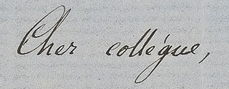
Cher collègue,
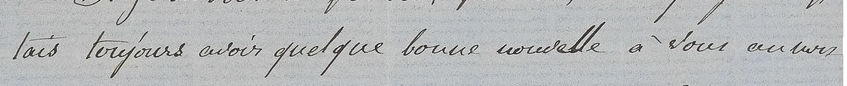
tais toujours avoir quelque bonne nouvelle à vous annon-
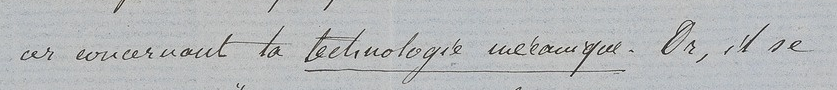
cer concernant la technologie mécanique. Or, il se
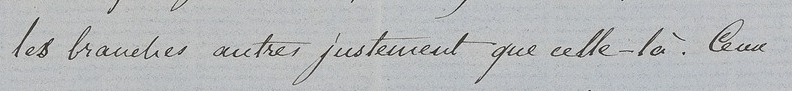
les branches autres justement que celle-là. Ceux
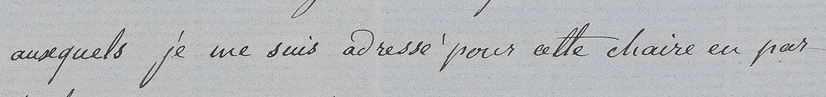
auxquels je me suis adressé pour cette chaire en par-
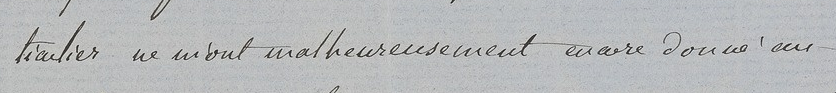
ticulier ne m'ont malheureusement encore donné au-
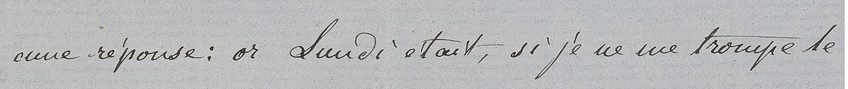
cune réponse: or Lundi était, si je ne me trompe le
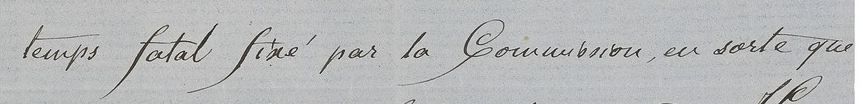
temps fatal fixé par la Commission, en sorte que
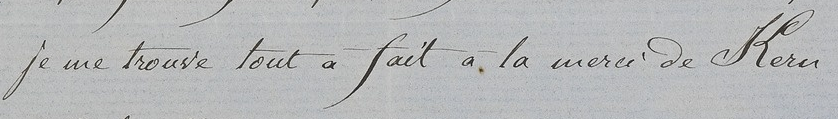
je me trouve tout à fait à la merci de Kern
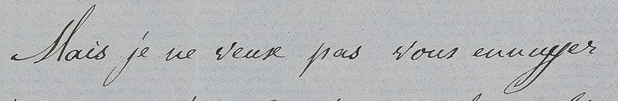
Mais je ne veux pas vous ennuyer
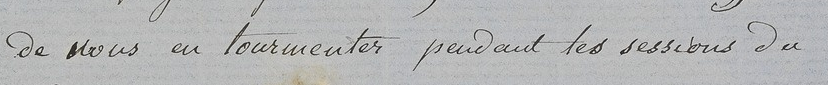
de vous en tourmenter pendant les sessions du
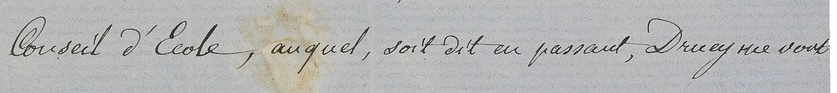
Conseil d'Ecole, auquel, soit dit en passant, Druey me vout
